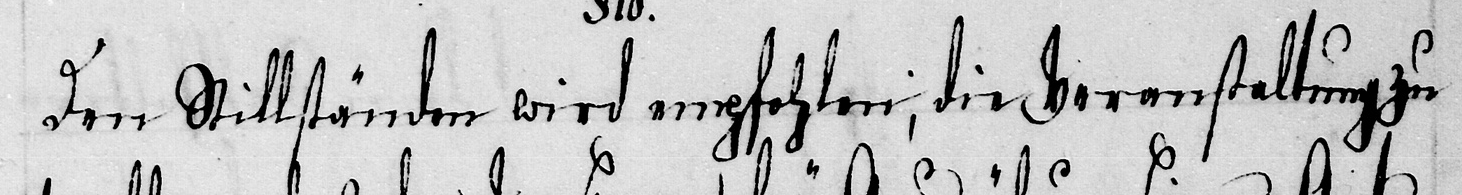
Den Stillständen wird empfohlen, die Veranstaltung zu
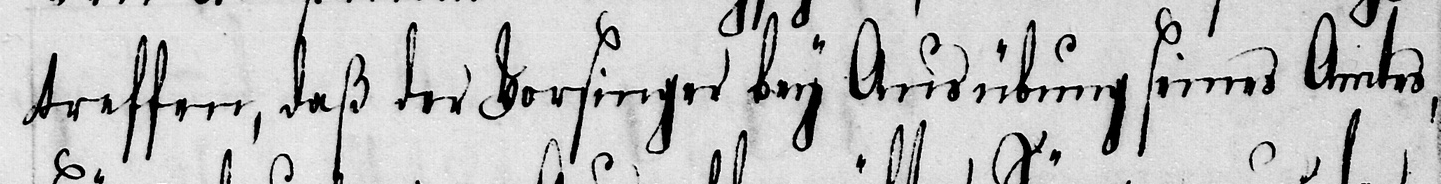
treffen, daß der Vorsinger bey Ausübung seines Amtes,
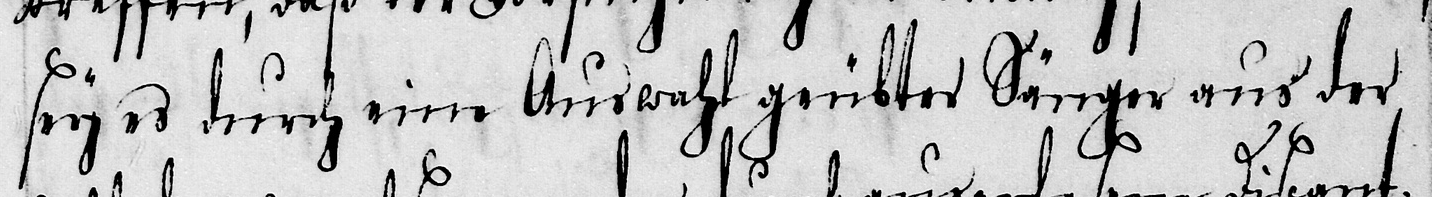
sey es durch eine Auswahl geübter Sänger aus der
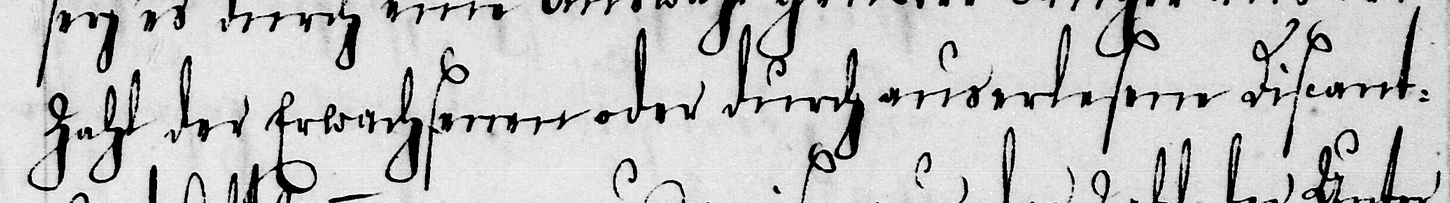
Zahl der Erwachsenen oder durch auserlesene Discant-
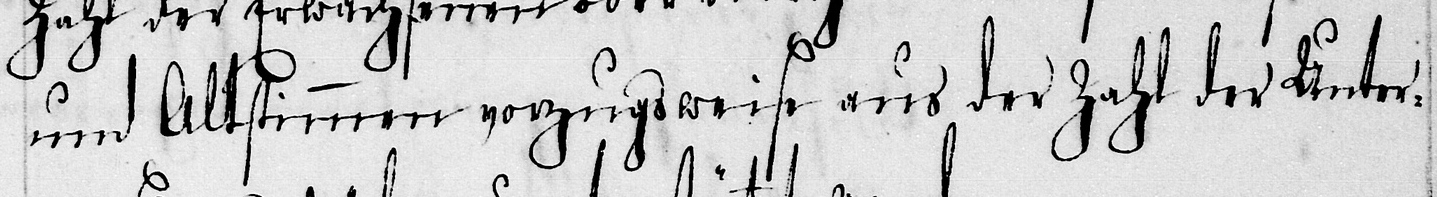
und Altstimmen vorzugsweise aus der Zahl der Unter¬
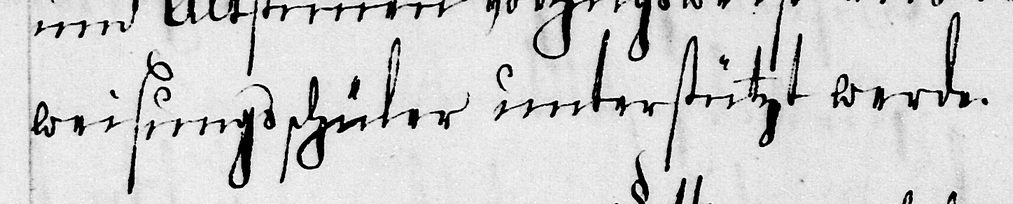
weisungsschüler unterstützt werde.
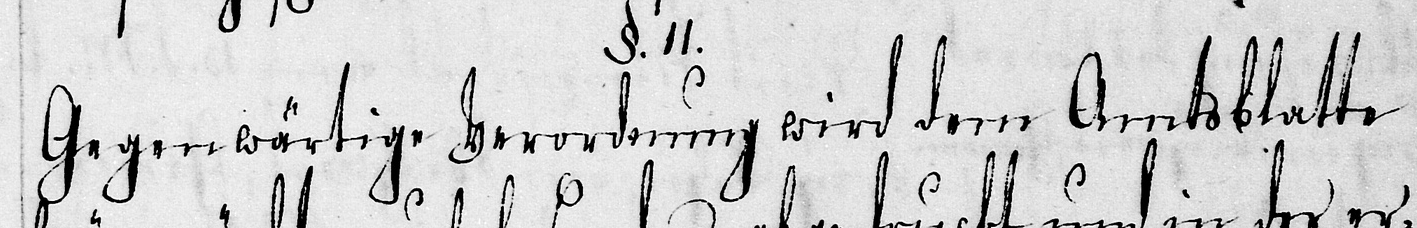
Gegenwärtige Verordnung wird dem Amtsblatte
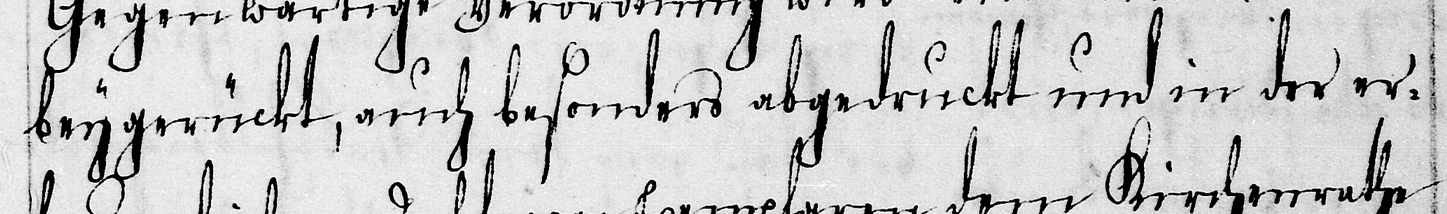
beygerückt, auch besonders abgedruckt und in der er¬
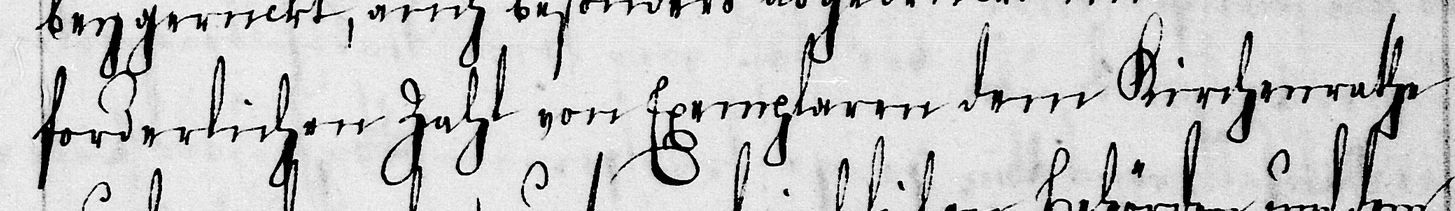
forderlichen Zahl von Exemplaren dem Kirchenrathe
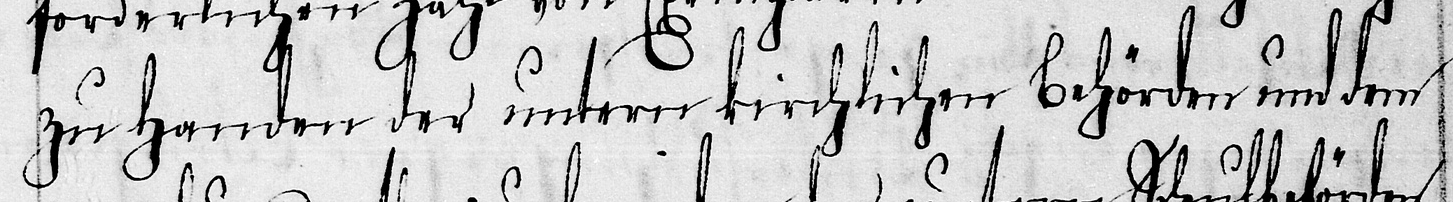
zu Handen der untern kirchlichen Behörden und dem
